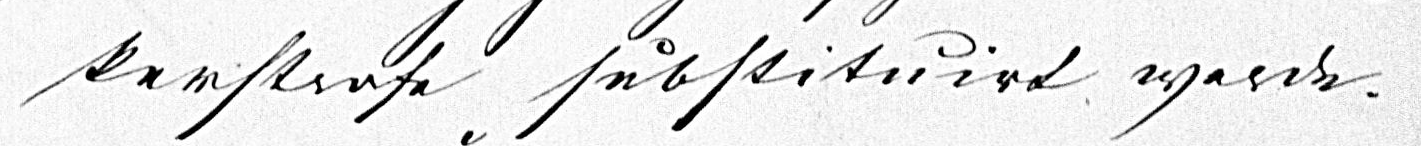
kerstrafe substituirt worde.
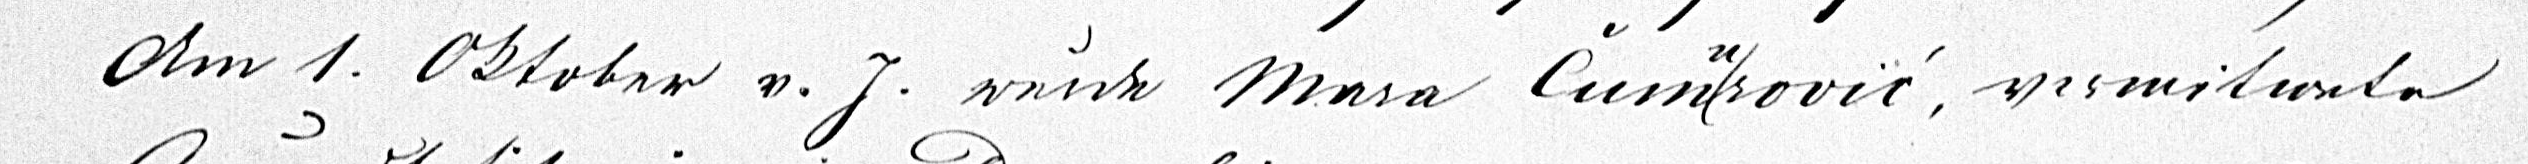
Am 1. Oktobe v. J. wurde Mara Cumurović, verwitwete
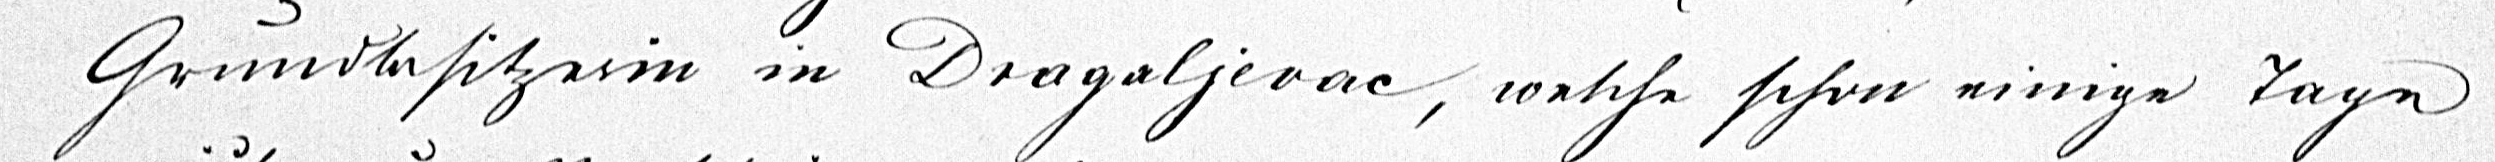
Grundbesitzerin in Dragaljevac, welche schon einige Tage
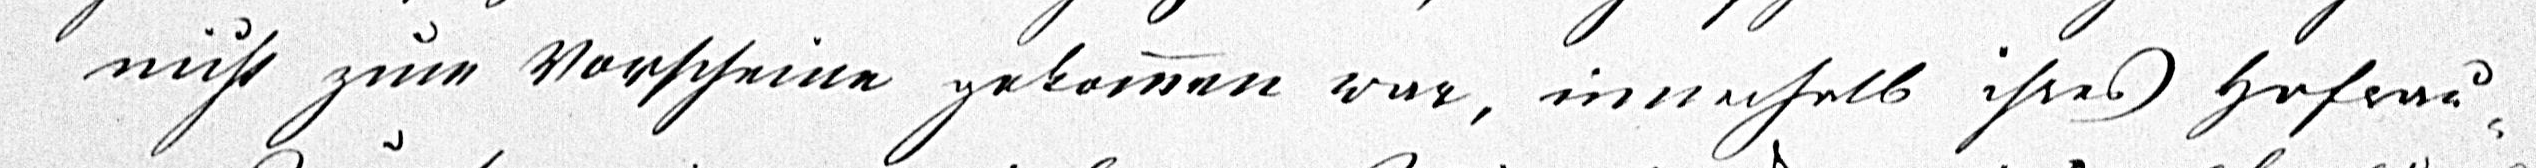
nicht zum vorscheine gekommen war, inxx ihres Hofrau¬
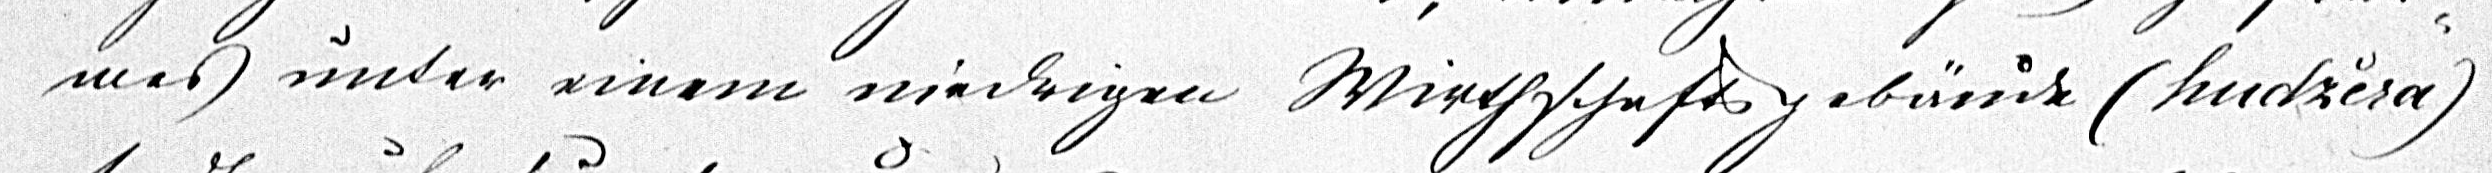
mes unter einem niedrigen Wirthschaftsgebäude (hudžera)
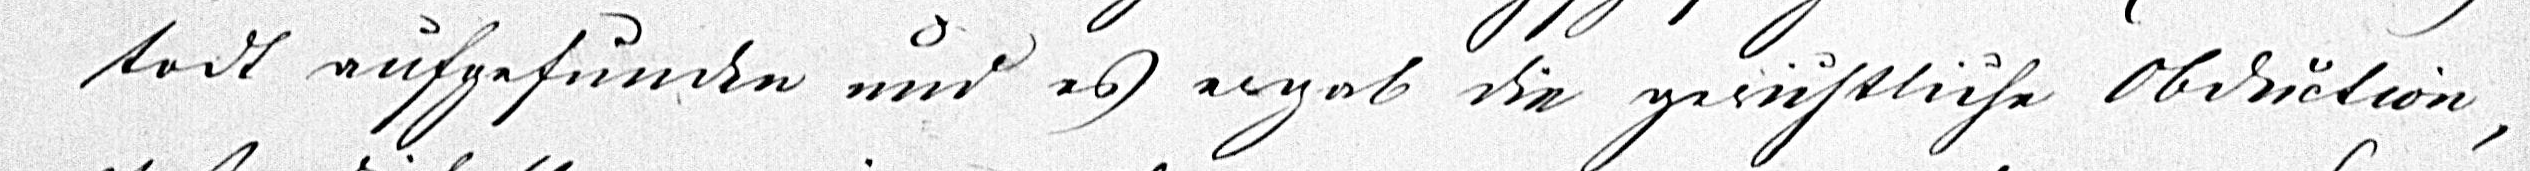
todt augefunden und es ergab die gerichtliche Obduction,
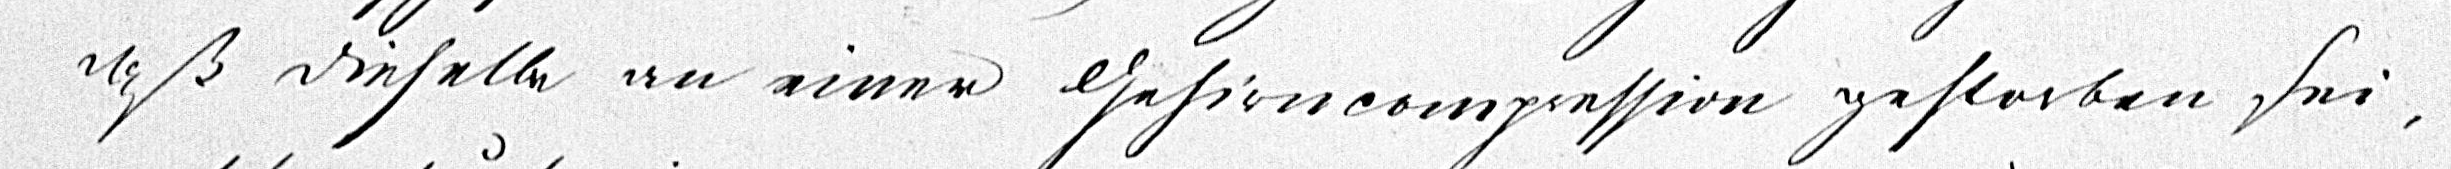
daß dieselbe an einer Gehirncompression gestorben sei,
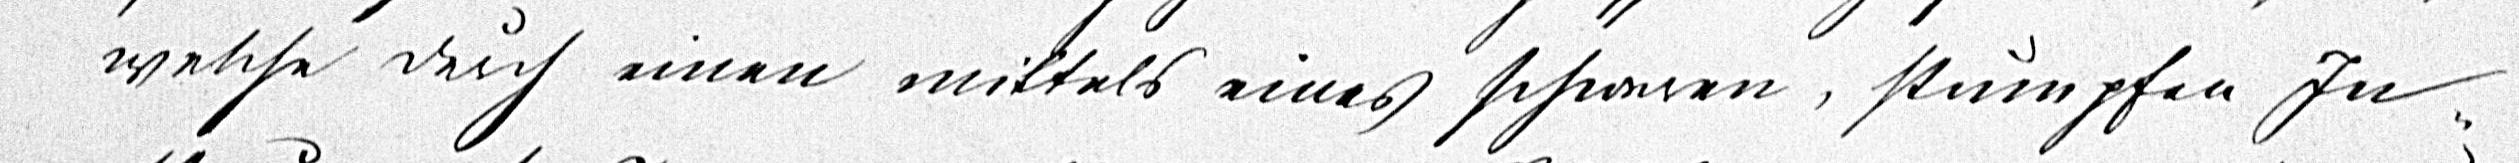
welche durch einen mittels eines schweren, stumpfen In¬
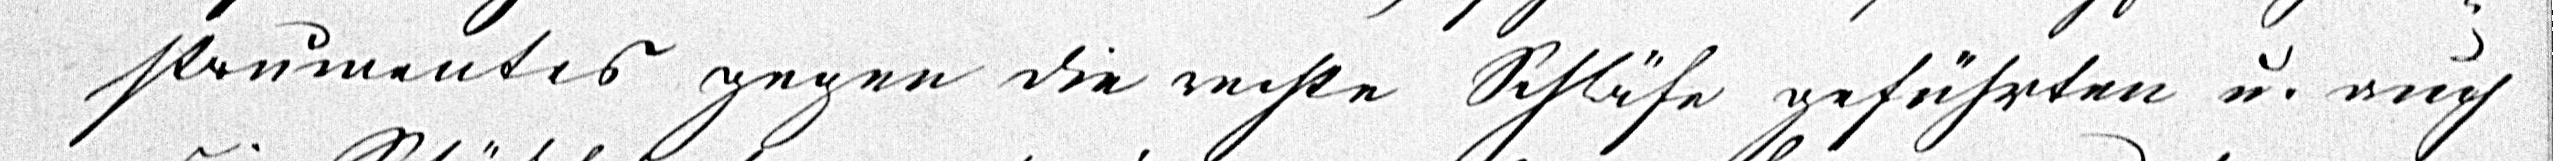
strumentes gegen die rechte Schläfe geführten u. auch
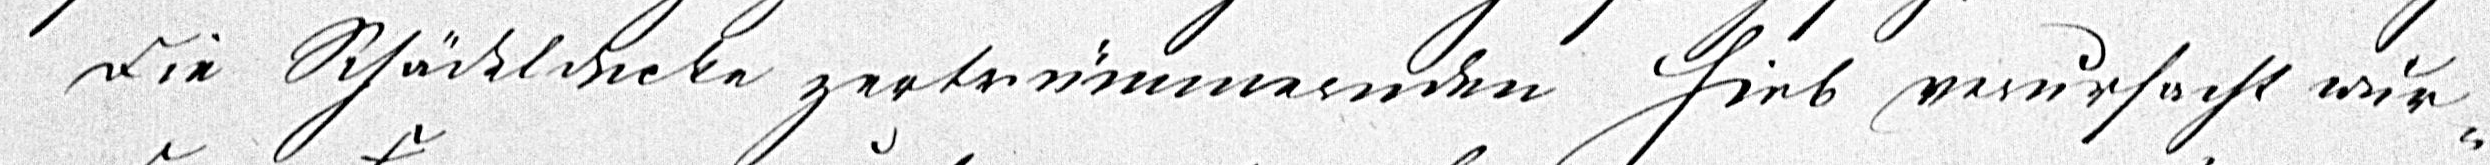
die Schädeldecke zertrümmernden Hieb verursacht wur¬
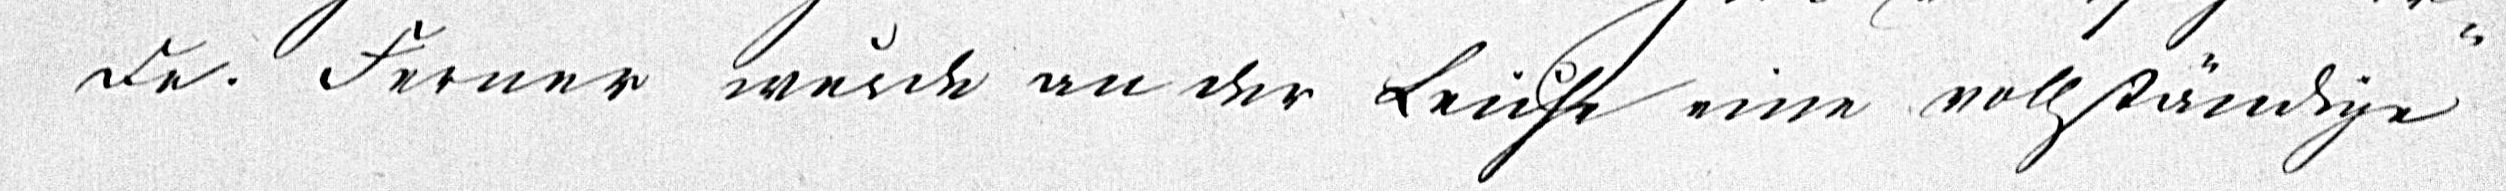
de. Ferner werde an der Leiche eine vollständige
